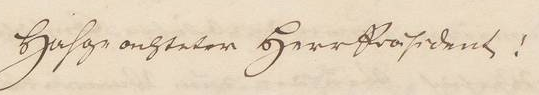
Hochgeachteter Herr Präsident!
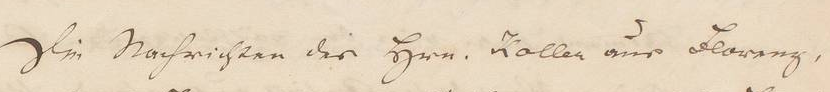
Die Nachrichten des Hrn. Koller aus Florenz,
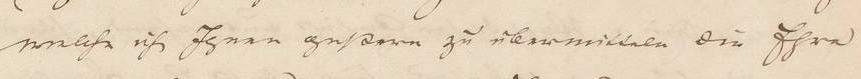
welche ich Ihnen gestern zu übermitteln die Ehre
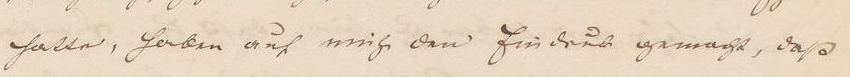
hatte, haben auf mich den Eindruk gemacht, daß
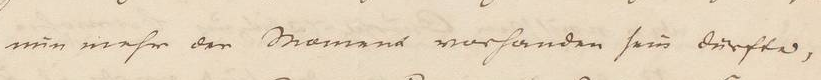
nun mehr der Moment vorhanden sein dürfte,
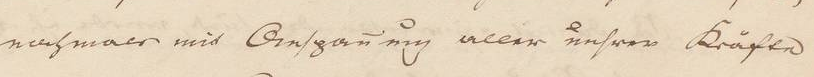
nochmals mit Anspannung aller unsrer Kräfte
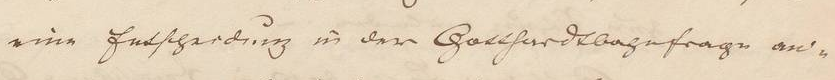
eine Entscheidung in der Gotthardtbahnfrage an-
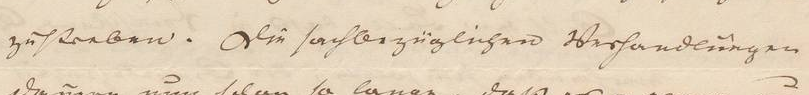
zustreben. Die sachbezüglichen Verhandlungen
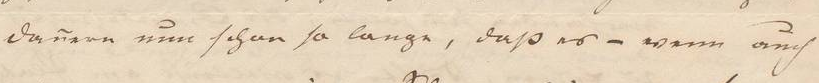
dauern nun schon so lange, daß es – wenn auch
